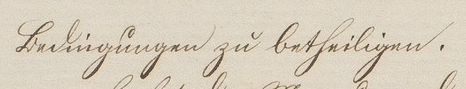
Bedingungen zu betheiligen.
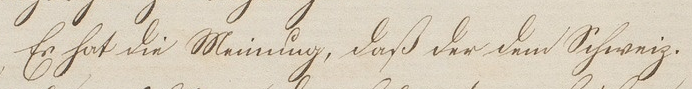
Es hat die Meinung, daß der dem Schweiz.
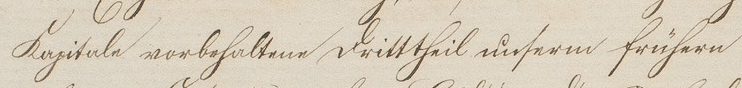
Kapitale vorbehaltene Dritttheil unserm frühern
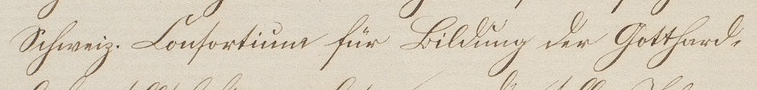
Schweiz. Consortium für Bildung der Gotthard-
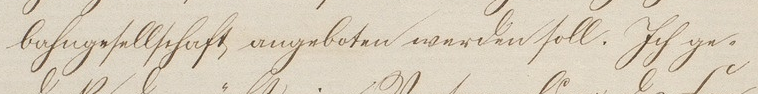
bahngesellschaft angeboten werden soll. Ich ge-
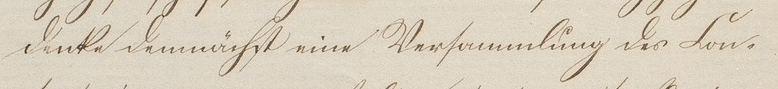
denke demnächst eine Versammlung des Con-
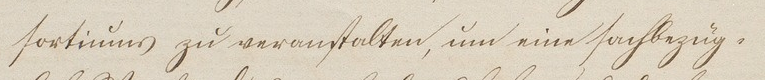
sortiums zu veranstalten, um eine sachbezüg-
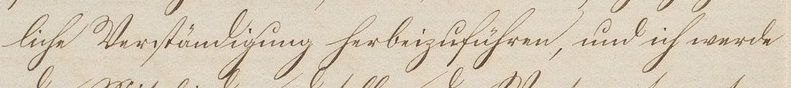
liche Verständigung herbeizuführen, und ich werde
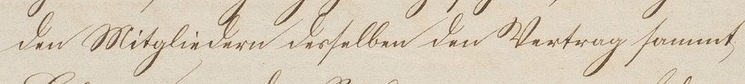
den Mitgliedern derselben den Vertrag sammt
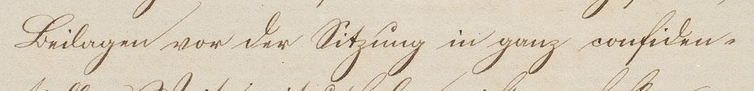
Beilagen vor der Sitzung in ganz confiden-
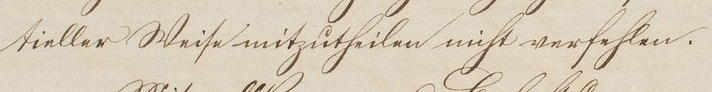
tieller Weise mitzutheilen nicht verfehlen.
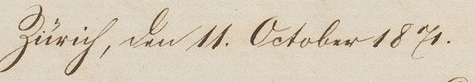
Zürich, den 11. October 1871.
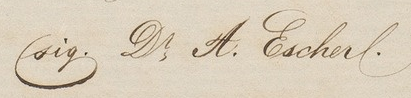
sig. Dr A. Escher.
